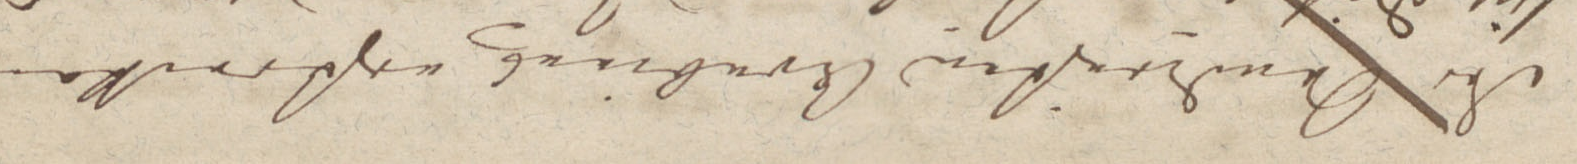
tonischen Ordonnanz, die zweifelsohne diese
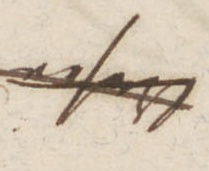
sich todten
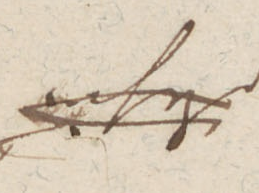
materiellen
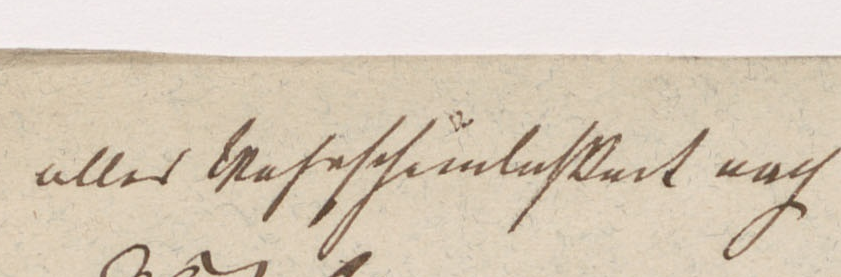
aller Wahrscheinlichkeit nach
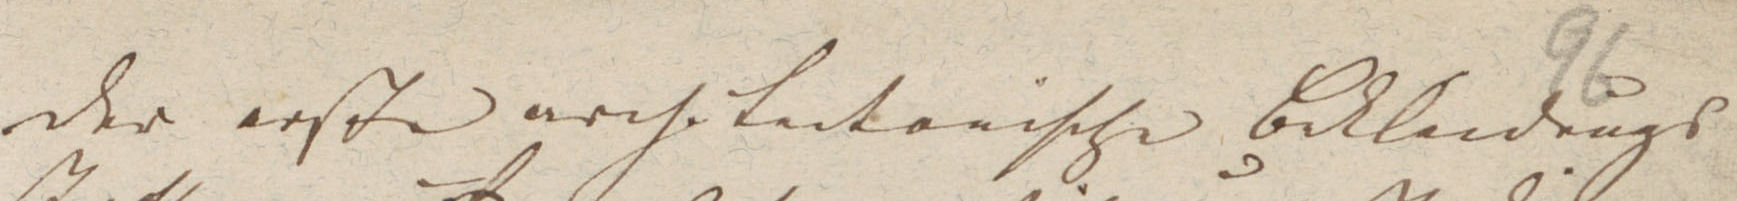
der erste architectonische Bekleidungs
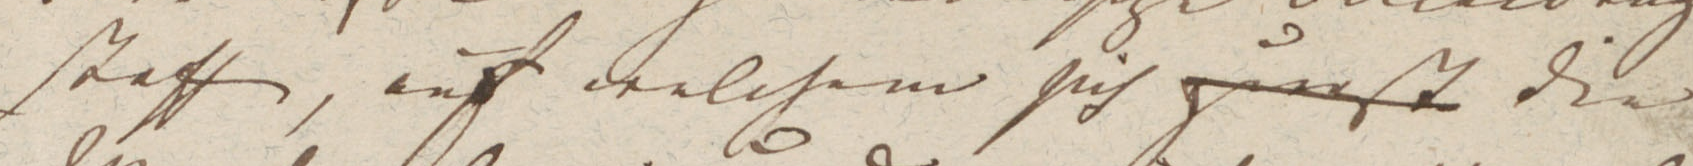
stoff, auf welchem sich zuerst die
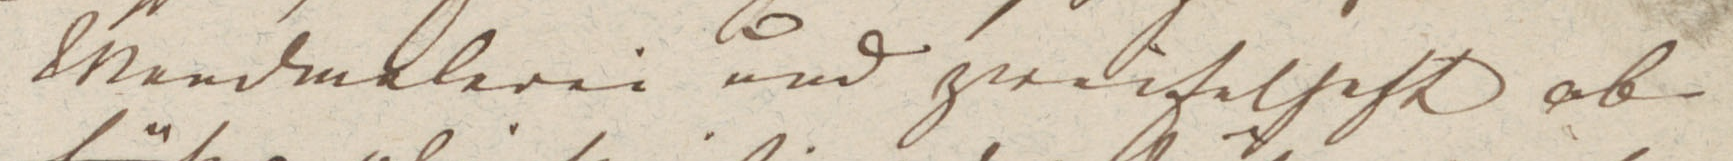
Wandmalerei und zweifelhaft ob
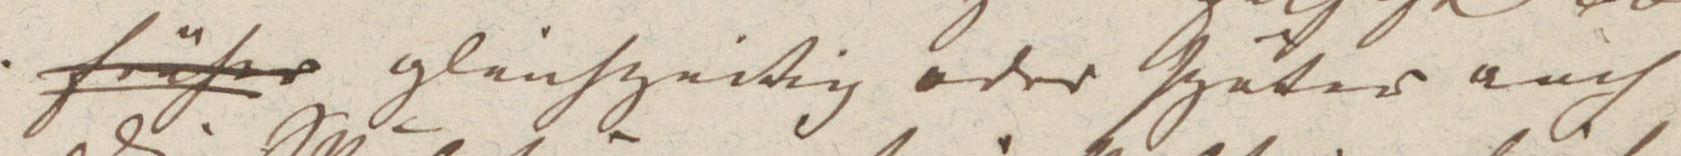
früher gleichzeitig oder später auch
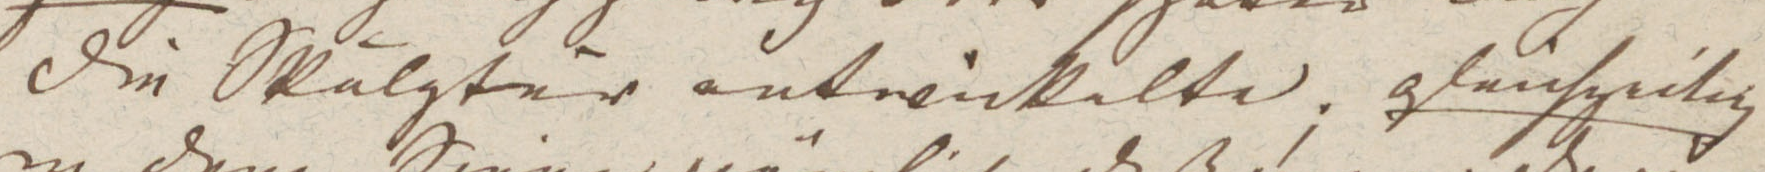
die Skulptur entwickelte; gleichzeitig
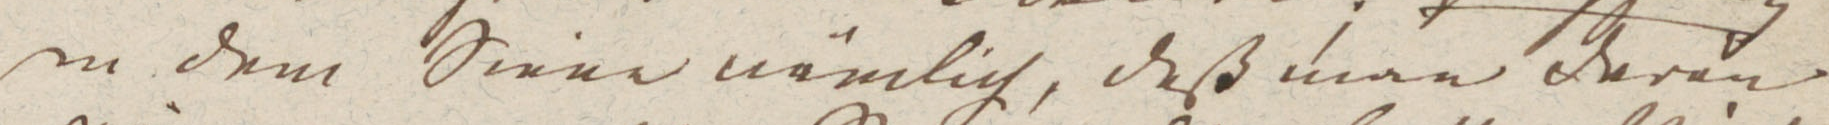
in dem Sinne nämlich, dass man daran
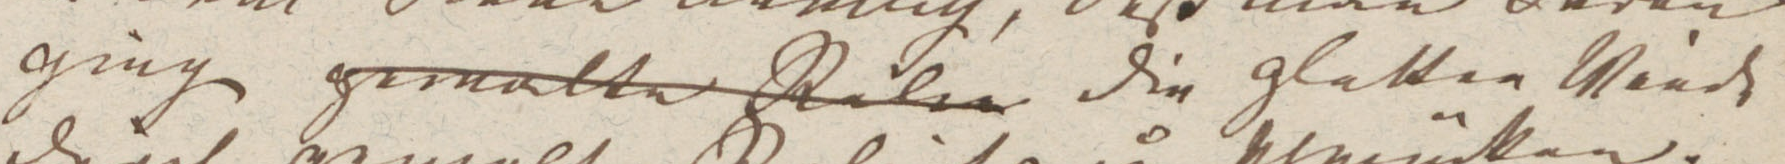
ging gemalte Relie die glatten Wände
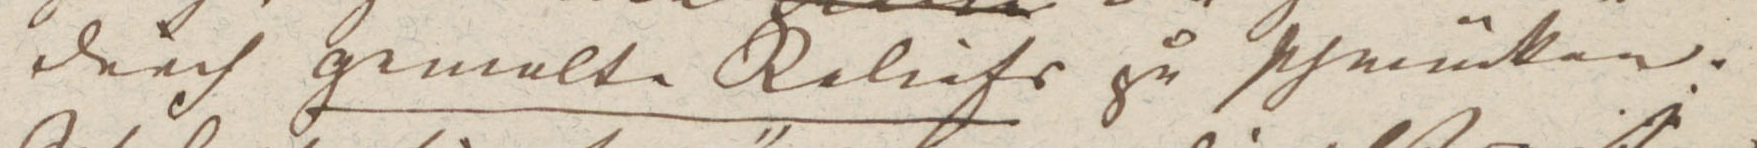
durch gemalte Reliefs zu schmücken.
